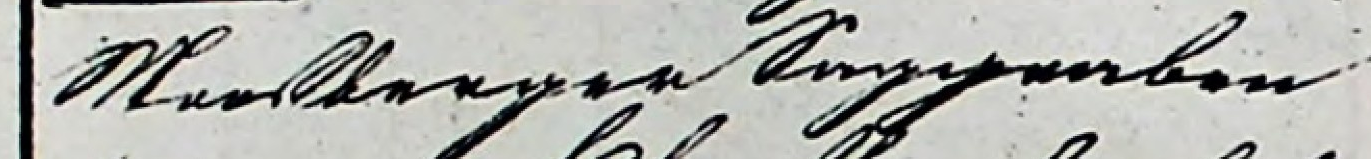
Marsberger Sagegraben
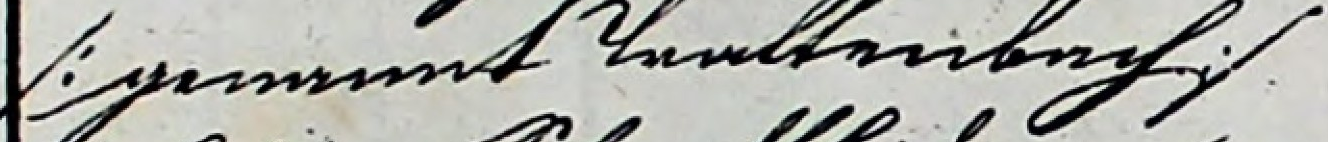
/: genannt Trattenbach :/
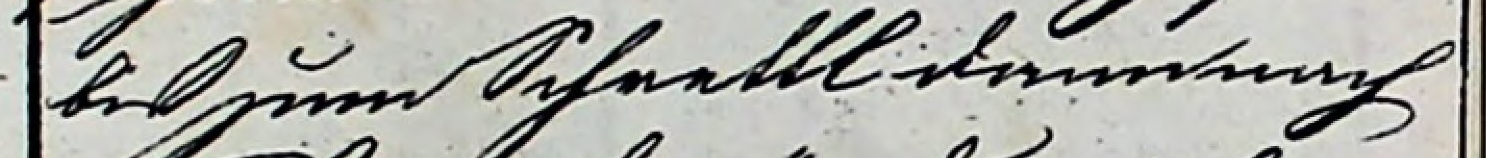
bis zum Schrettl dann nach
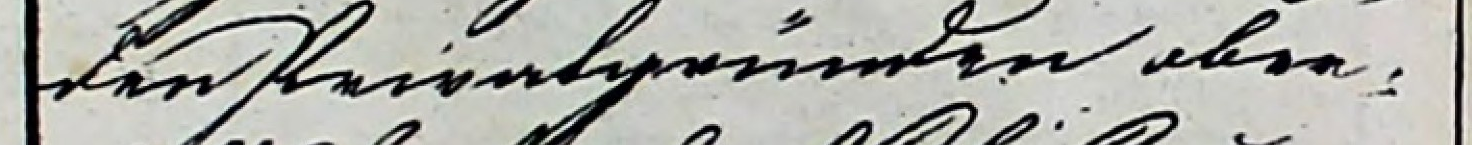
den Privatgründen ober„
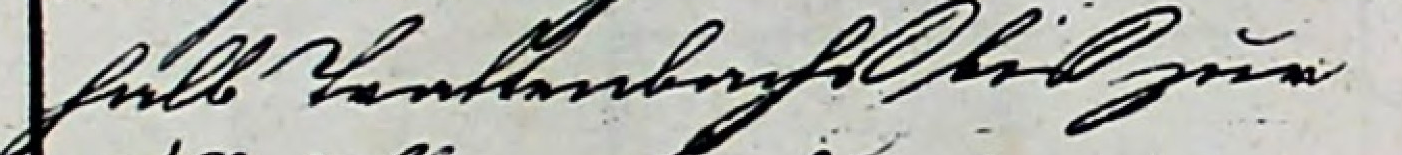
halb Trattenbachs bis zur
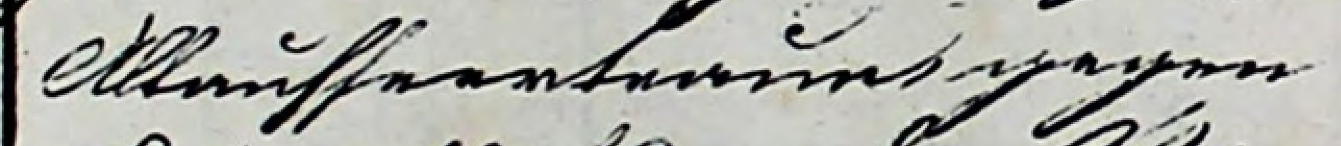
Altausseertraun, gegen
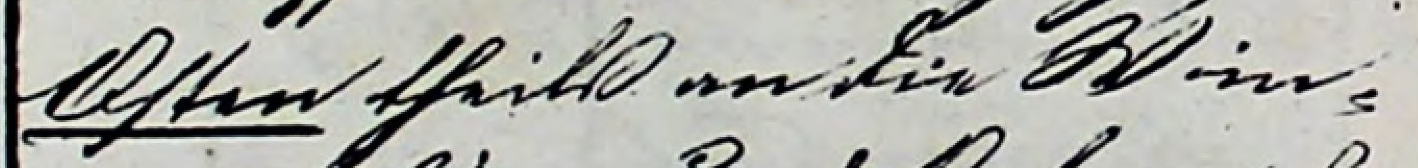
Osten theils an die Wim„
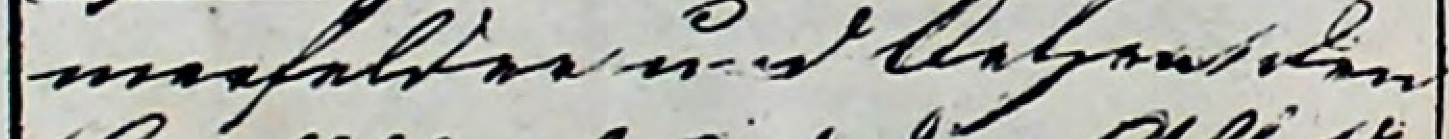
merfelder u. d Oetzen den
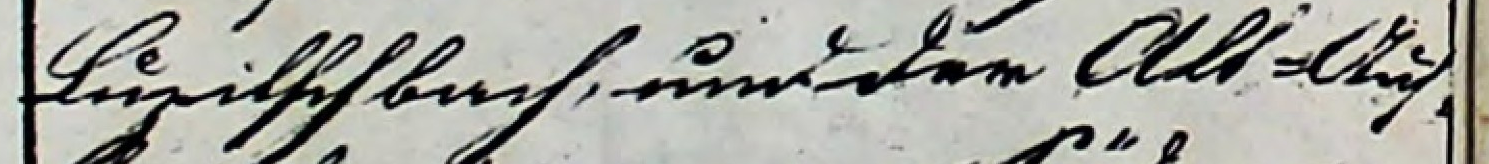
Lupitschbach, und der Alt=Aus„
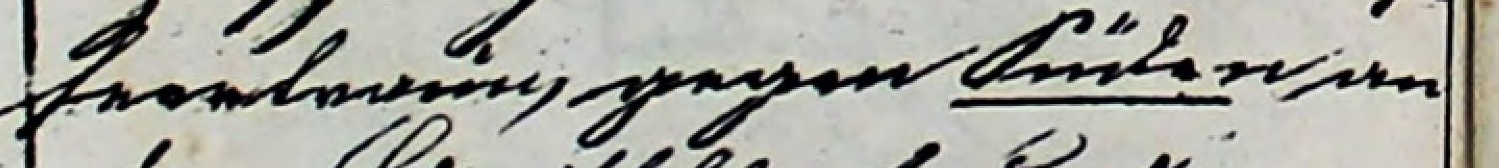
seertraun, gegen Süden an
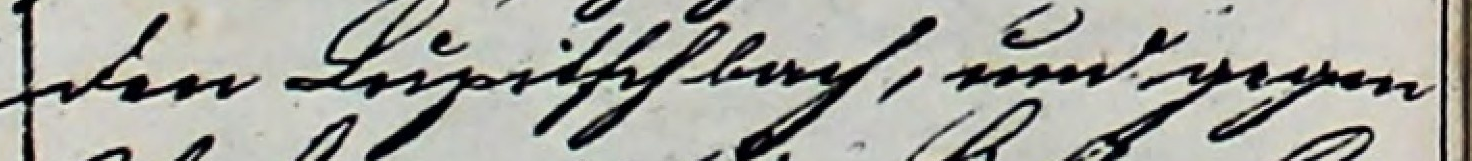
den Lupitschbach, und gegen
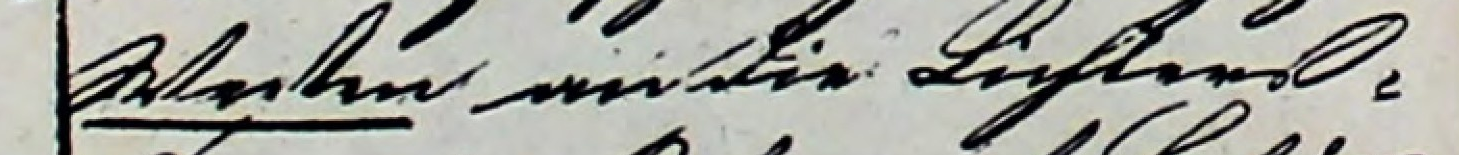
Westen an die Lichters„
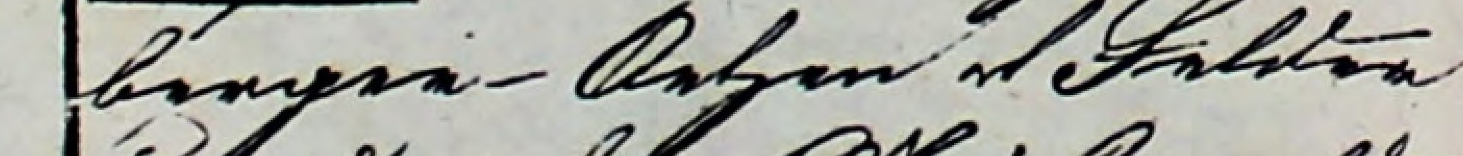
berger - Oetzen v Felder
